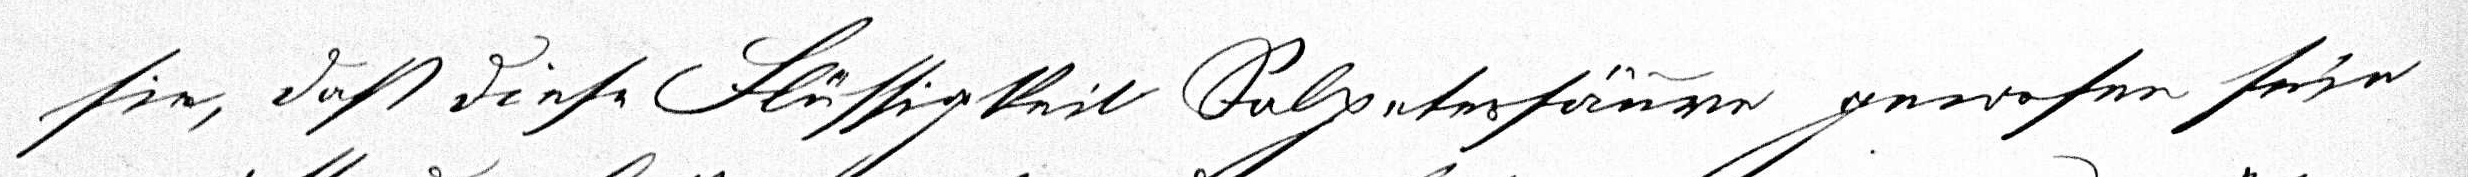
sie, daß diese Flüssigkeit Salpetersäure gewesen sein
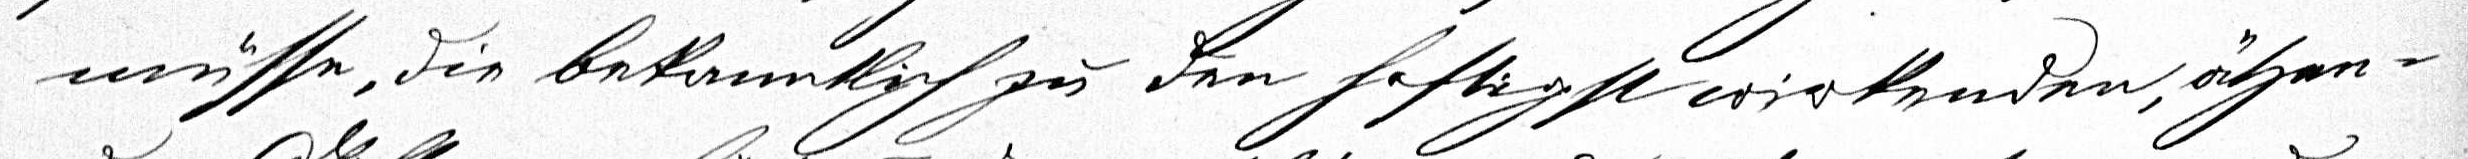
müsse, die bekanntlich zu den festigst wirkenden, ätzen¬
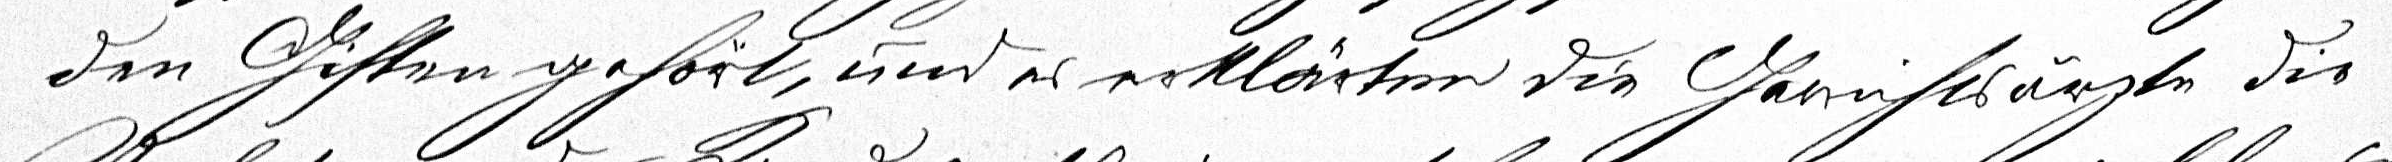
den Giften gehört, und er erklärten die Gerichtsärzte die
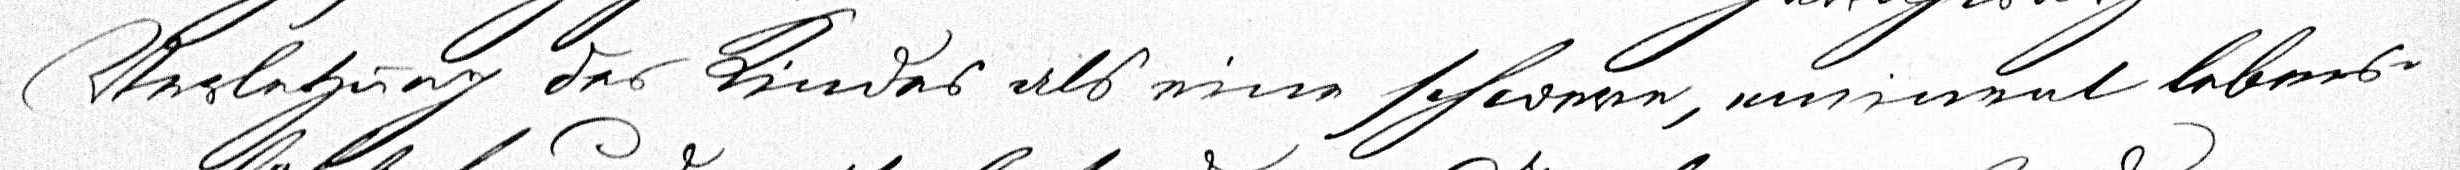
Verletzung des Kindes als eine schwere, eminent lebens¬
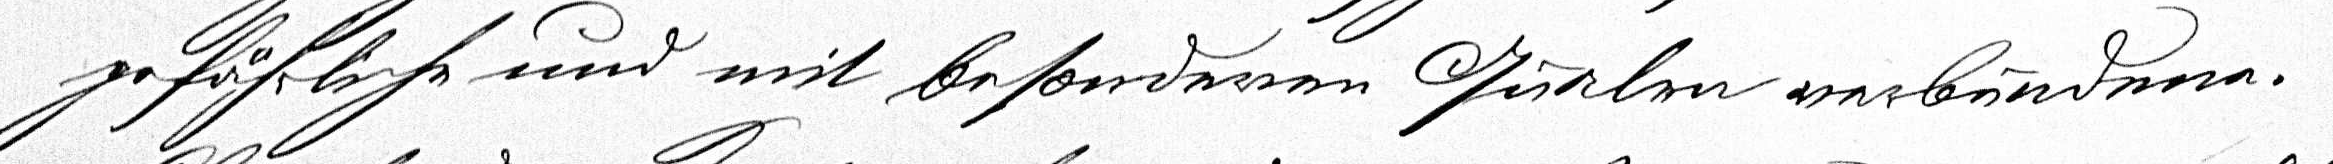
gefährliche und mit besonderen Qualen verbundene.
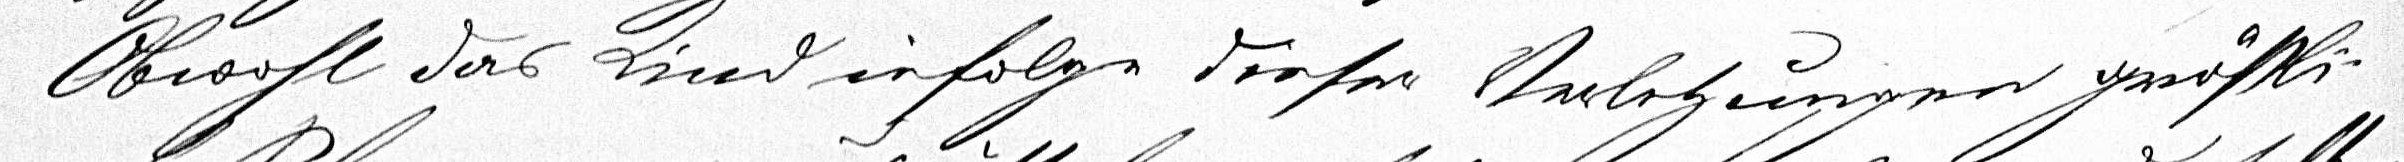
Obwohl das Kind infolge dieser Verletzungen gräßli¬
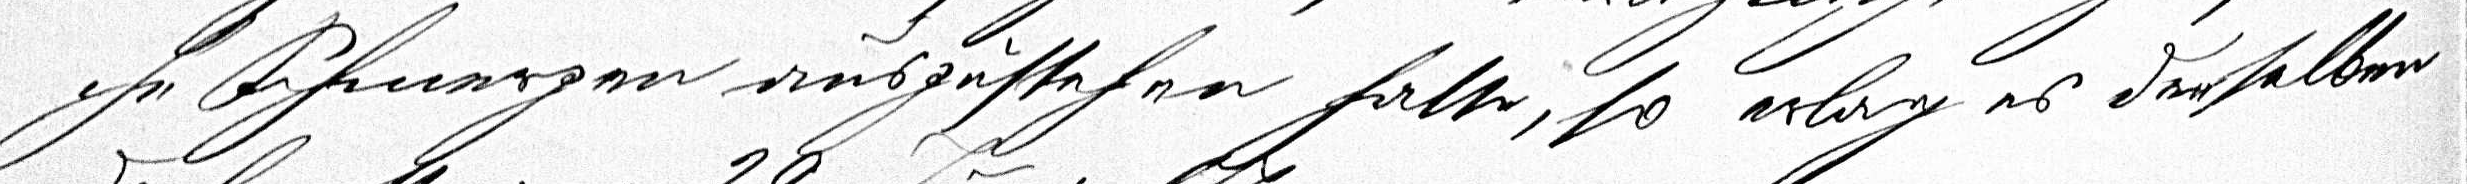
che Schmerzen auszustehen hatte, so erlag es derselben
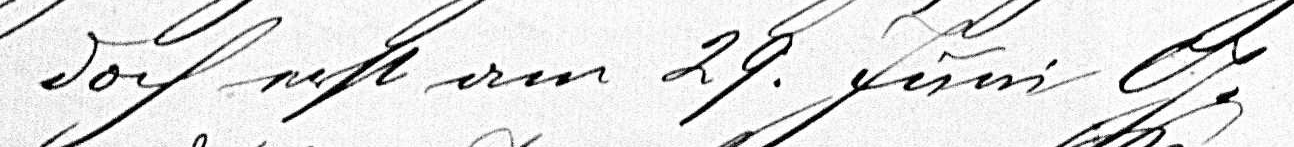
doch erst am 29. Juni lJ.
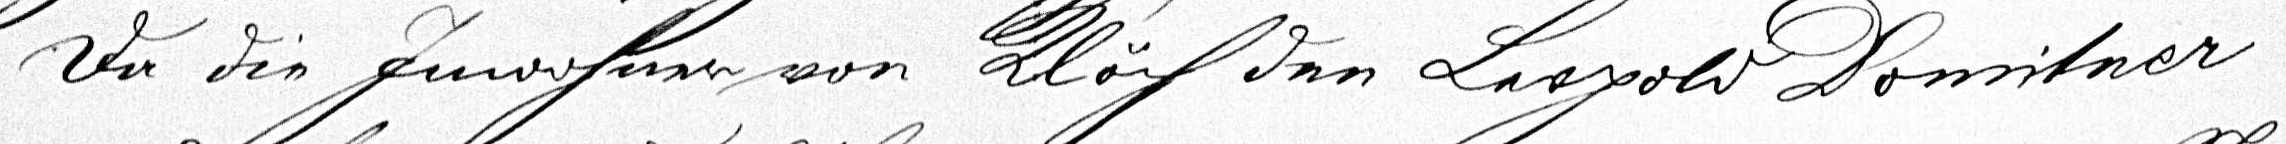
Da die Inwohner von Klöch den Leopold Domitner
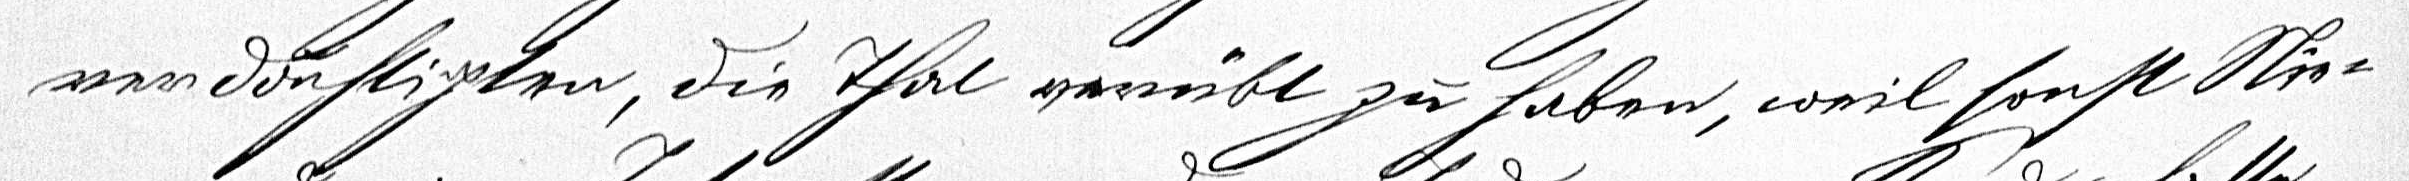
verdächtigten, die That verübt zu haben, weil sonst Nie¬
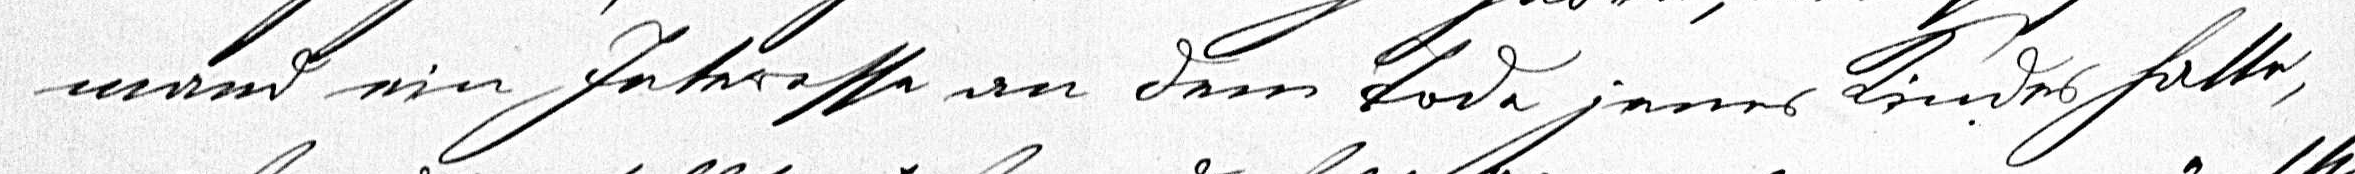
mand ein Interesse an dem Tode jenes Kindes hatte,
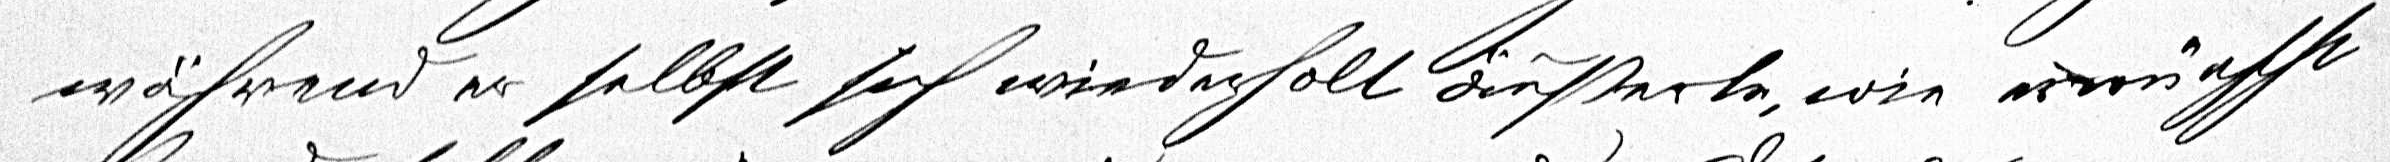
während er selbst sich wiederholt äußerte, wie erwünscht
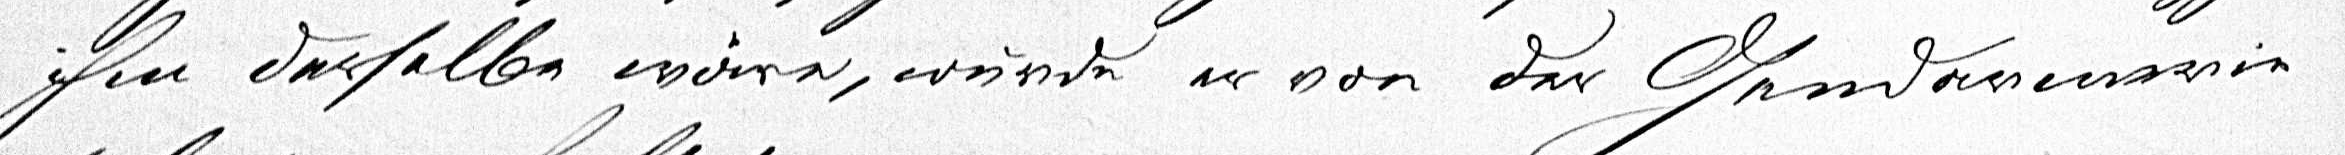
ihm derselbe wäre, wurde er von der Gendarmerie
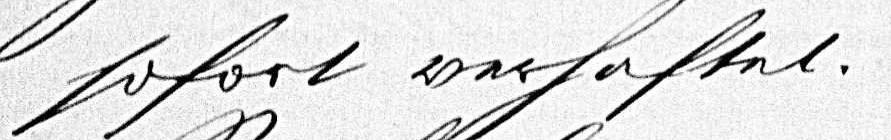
sofort verhaftet.
